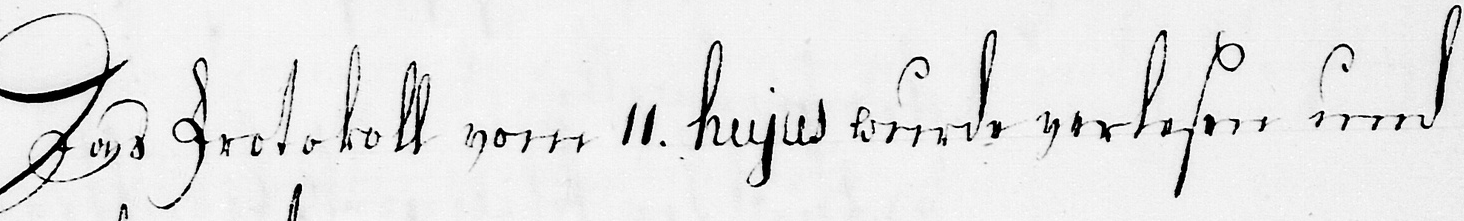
Das Protokoll vom 11. hujus wurde verlesen und
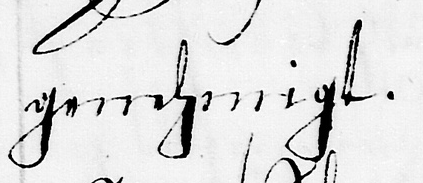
genehmigt.
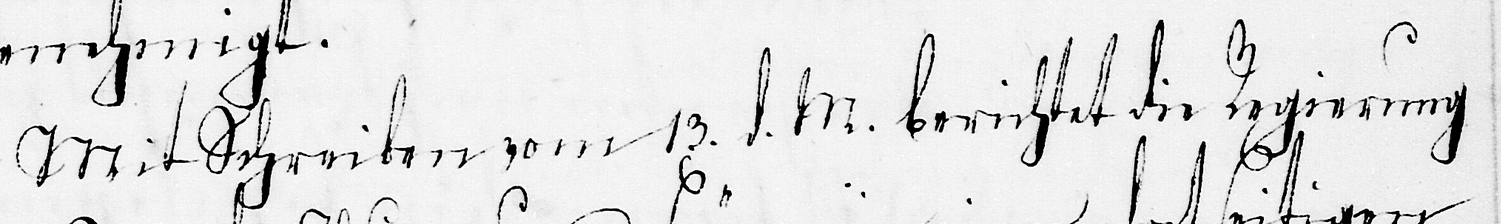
Mit Schreiben vom 13. d. M. berichtet die Regierung
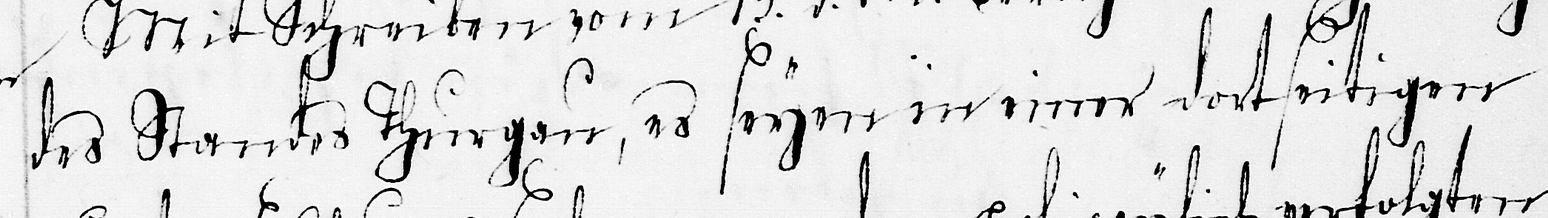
des Standes Thurgau, es seyen in einer dortseitigen
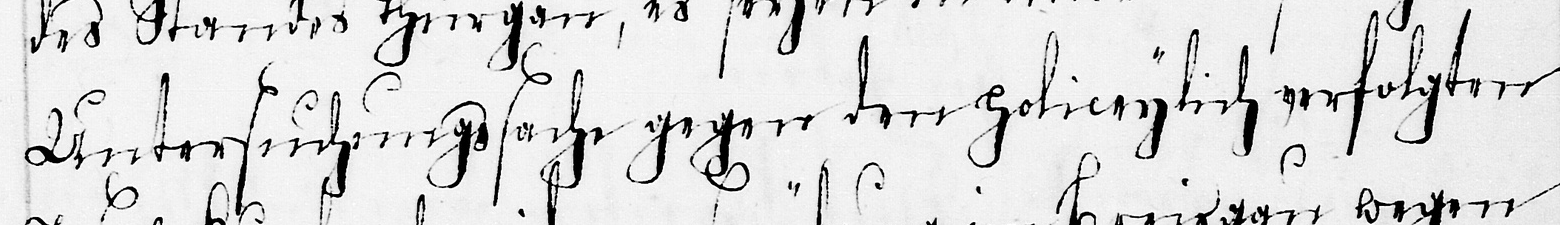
Untersuchungssache gegen den policeylich verfolgten
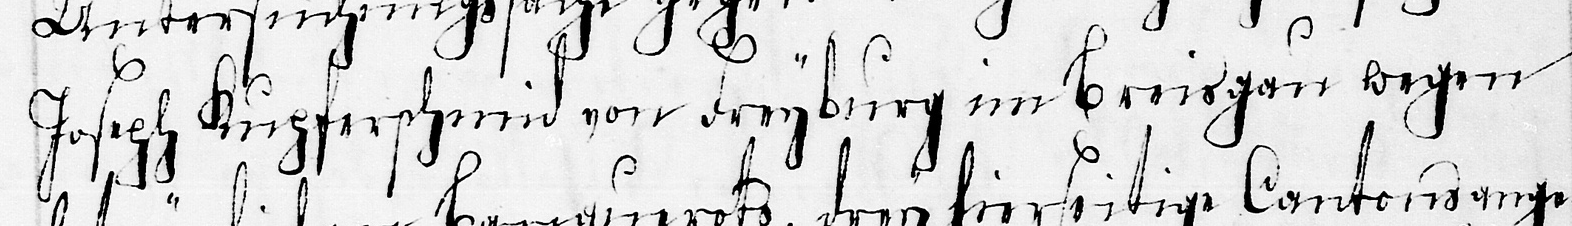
Joseph Kupferschmid von Freyburg im Breisgau wegen
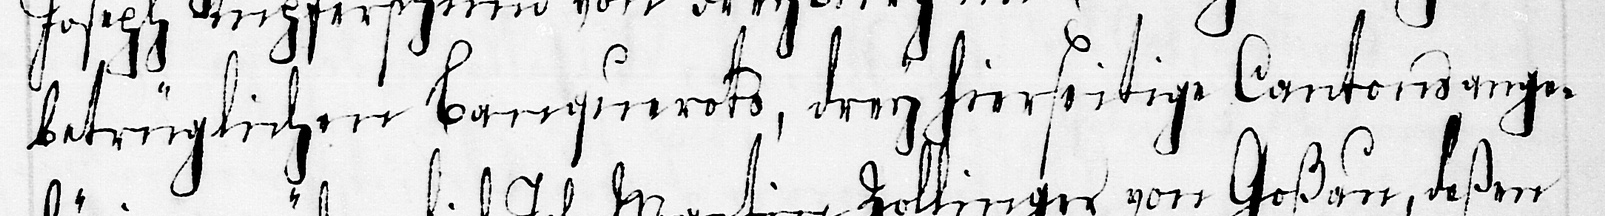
betrüglichen Banquerots, drey hierseitige Cantonsange¬
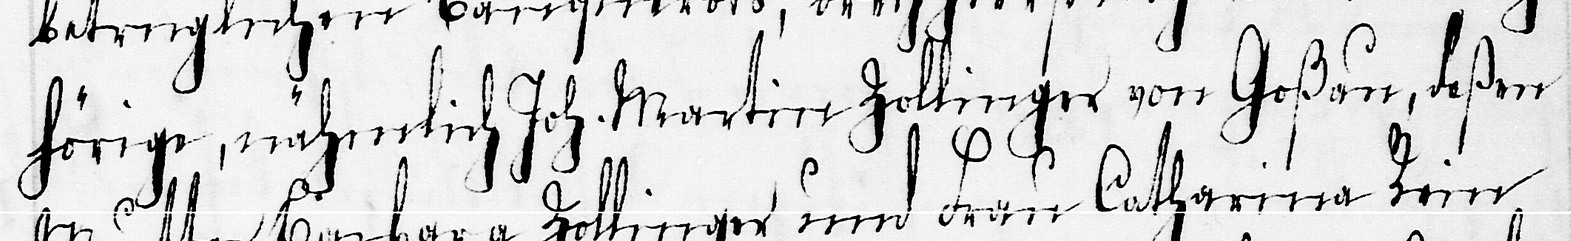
hörige, nähmlich Joh. Martin Zollinger von Goßau, deßen
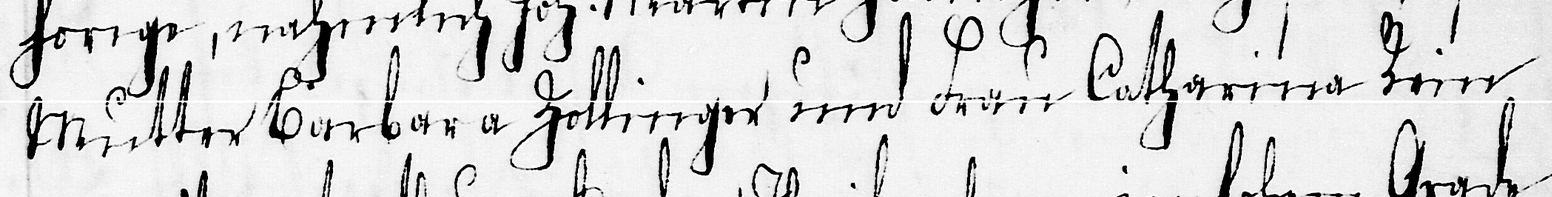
Mutter Barbara Zollinger und Frau Catharina Rein
